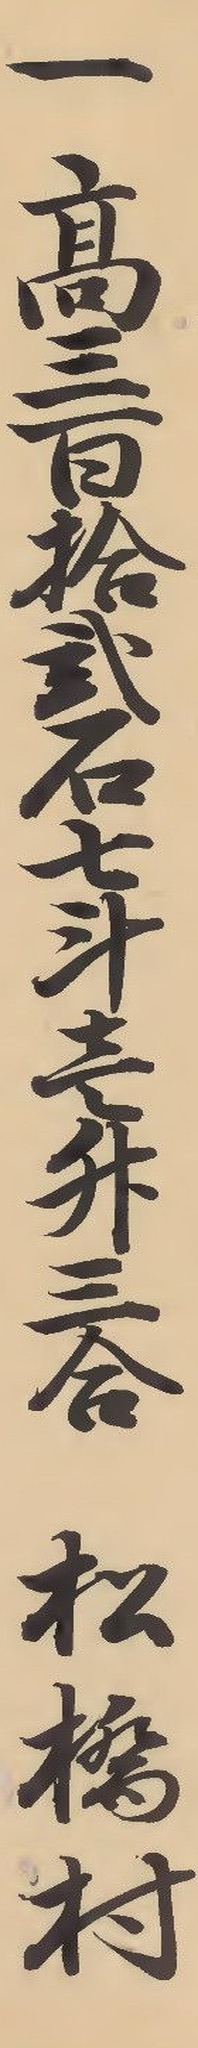一高三百拾弐石七斗壱升三合松橋村
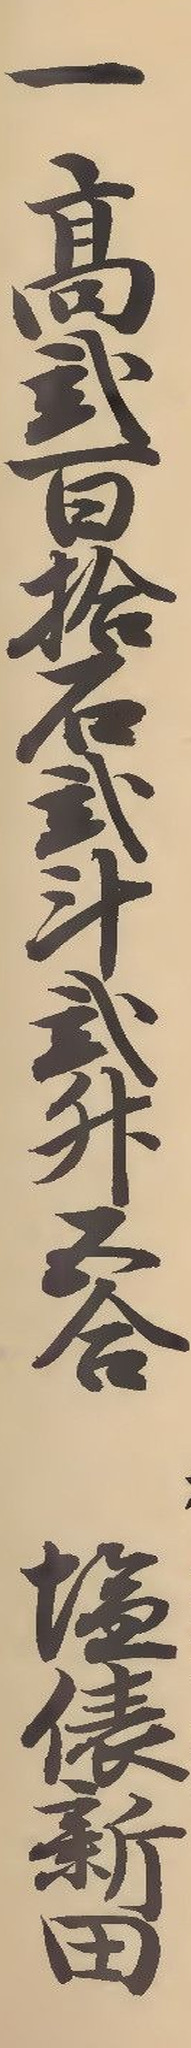一高弐百拾石弐斗弐升五合塩俵新田
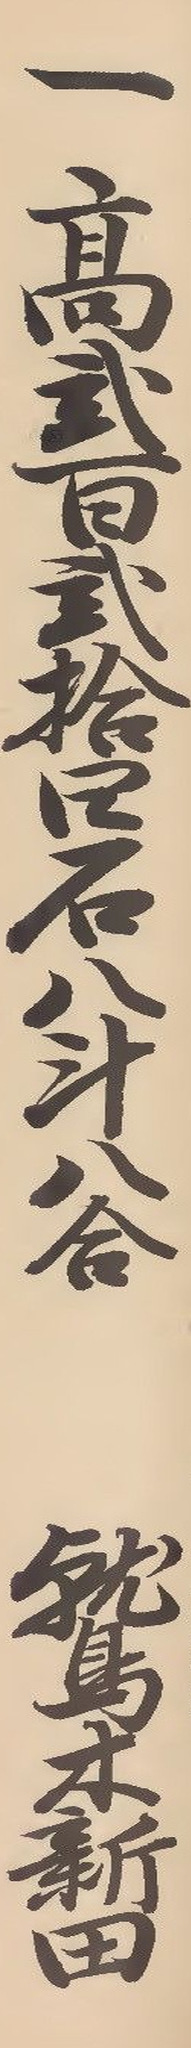一高弐百弐拾四石八斗八合鷲木新田
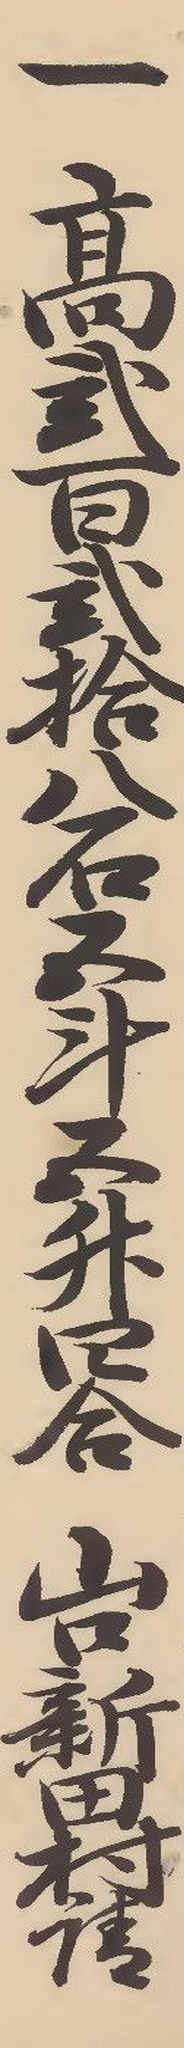一高弐百弐拾八石五斗五升四合山口新田請
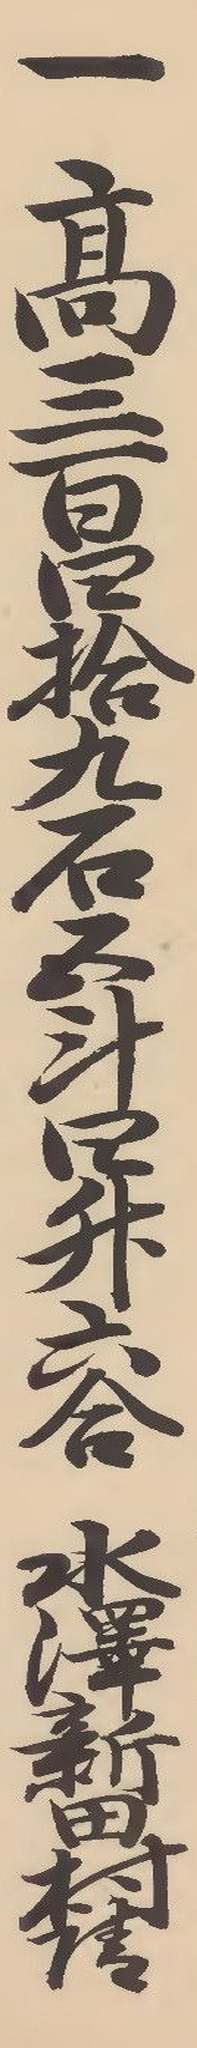一高三壱百四拾九石五斗四升六合水沢新田村請
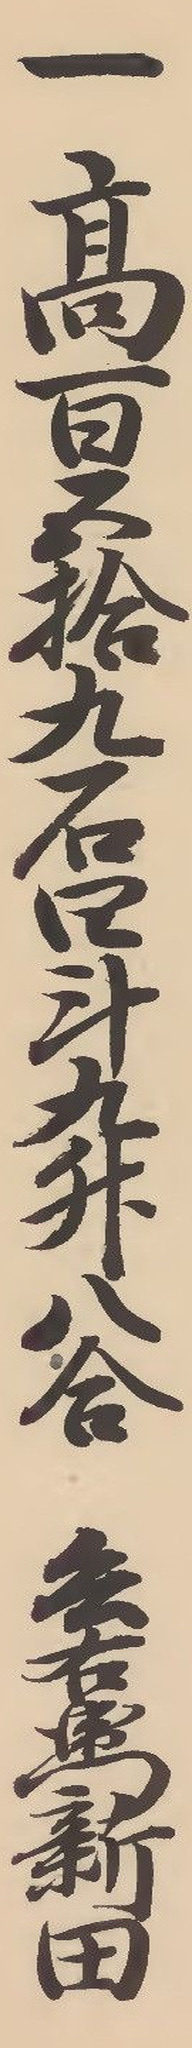一高百五拾九石四斗九升八合兵右衛門新田

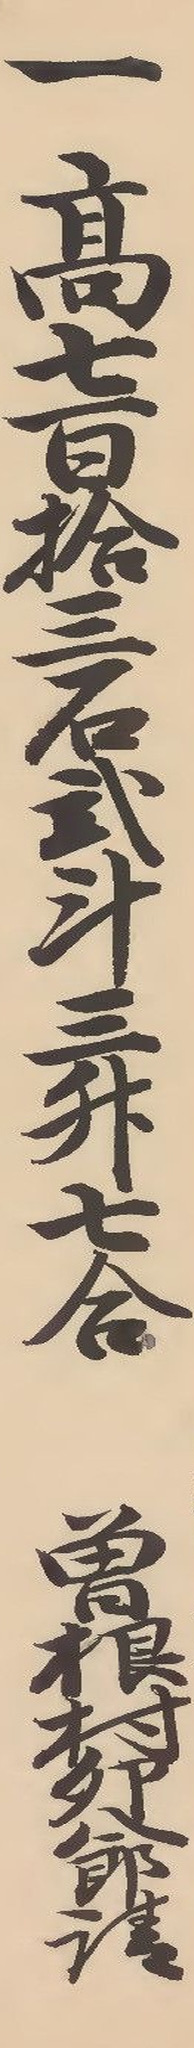一高七百拾三石弐斗三升七合曽根村卯八郎請
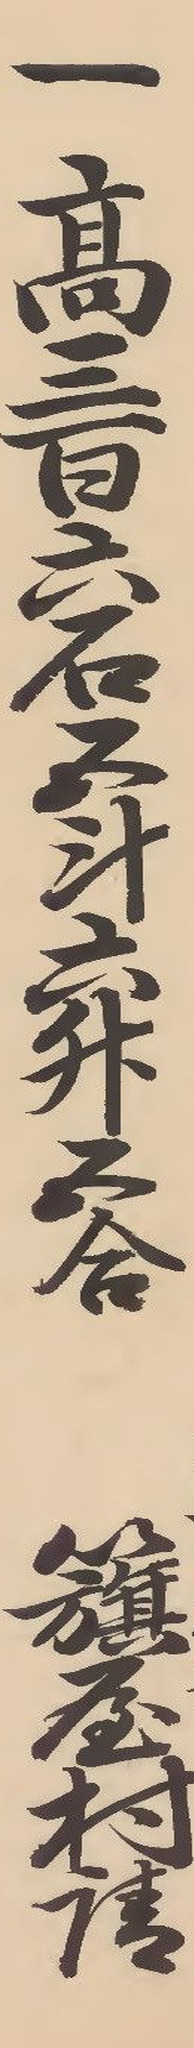一高三百六石五斗六升五合籏屋村請
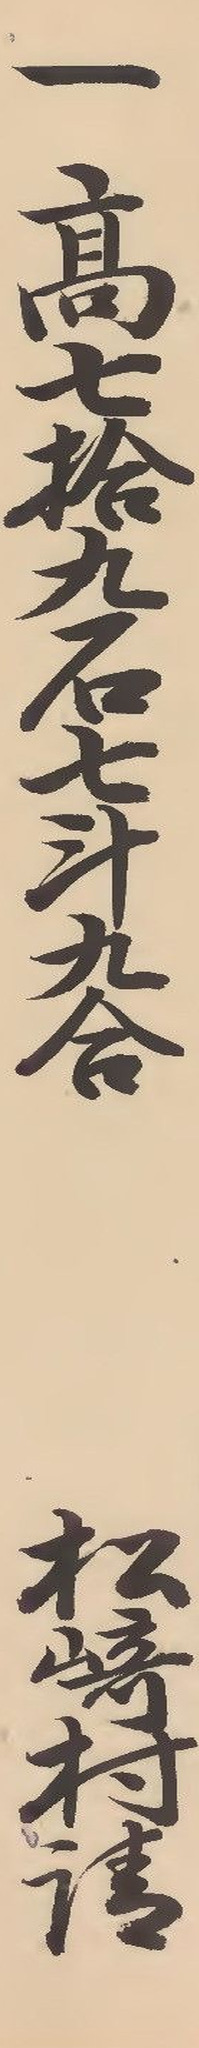一高七拾九石七斗九合松崎村請
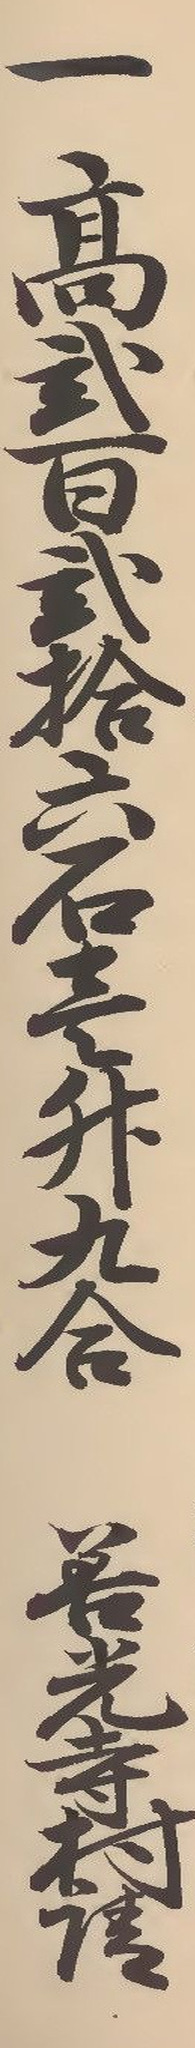一高弐百弐拾六石壱升九合善光寺村請
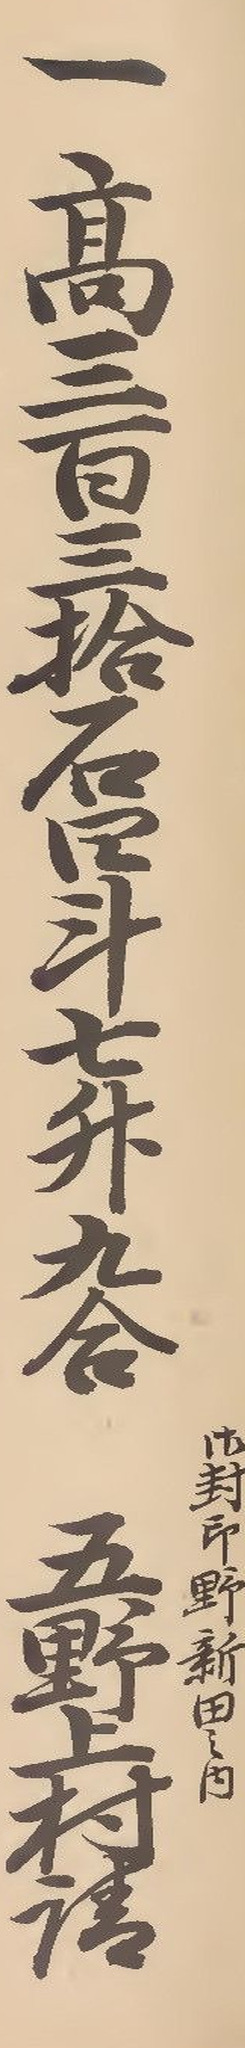一高三百三拾石四斗七升九合五野上村請
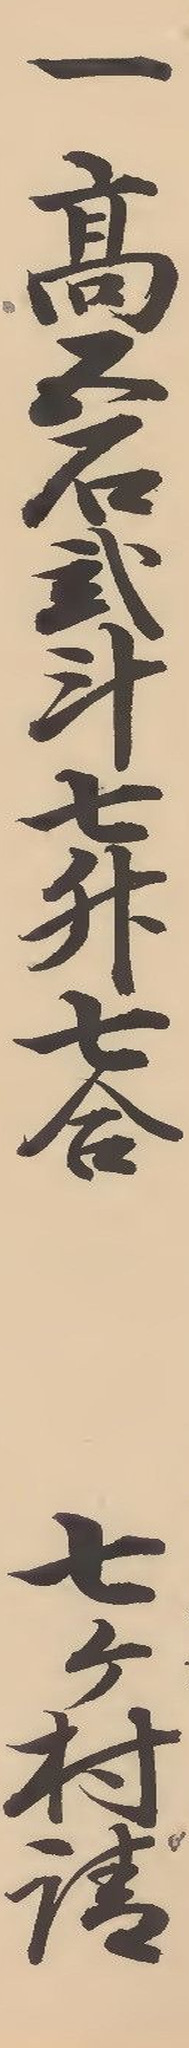一高五石弐斗七升七合七ヶ村請
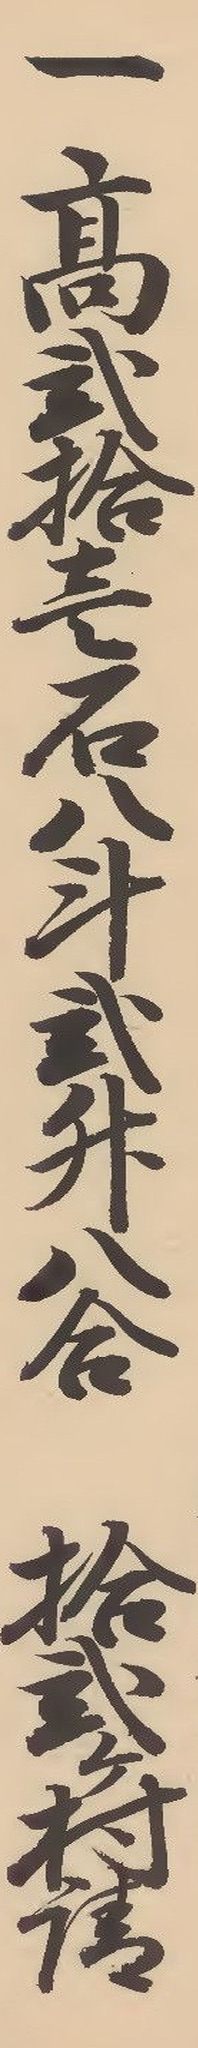一高弐拾壱石八斗弐升八合拾弐ヶ村請
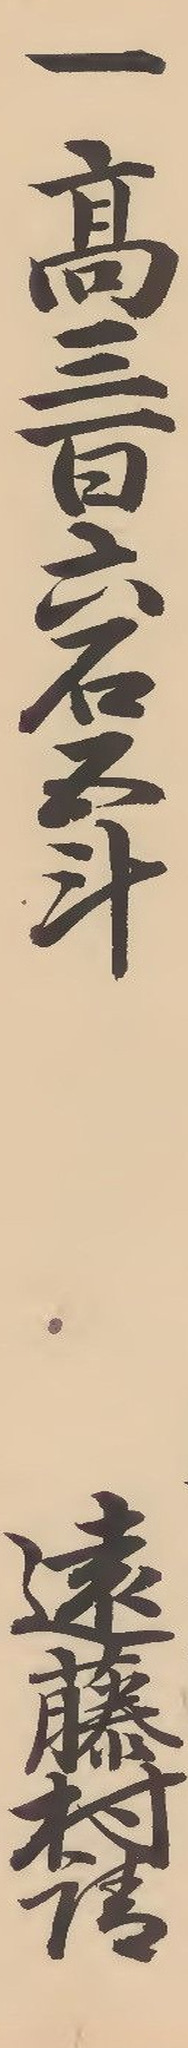一高三百六石五斗遠藤村請

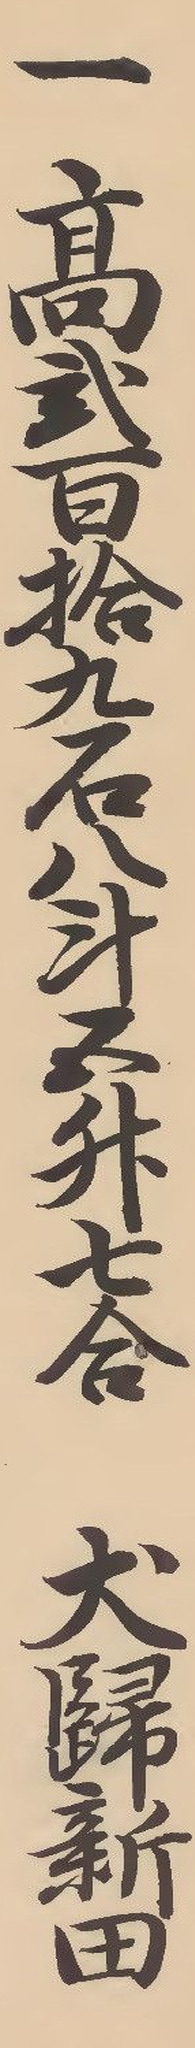一高弐百拾九石八斗五升七合犬帰新田
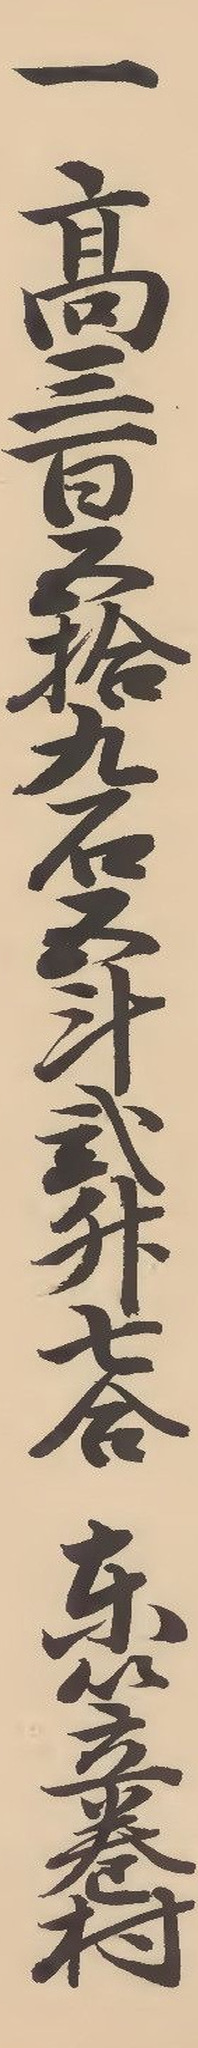一高三百五拾九石五斗弐升七合東笠巻村
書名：越後国郷帳　下
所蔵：国立公文書館 National Archives of Japan
